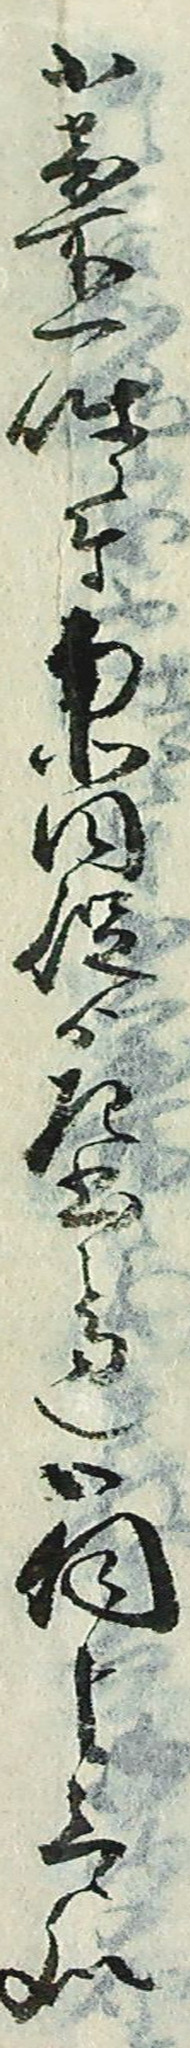小寄所一件に付南北同役ゟ左書之通御伺申上候処
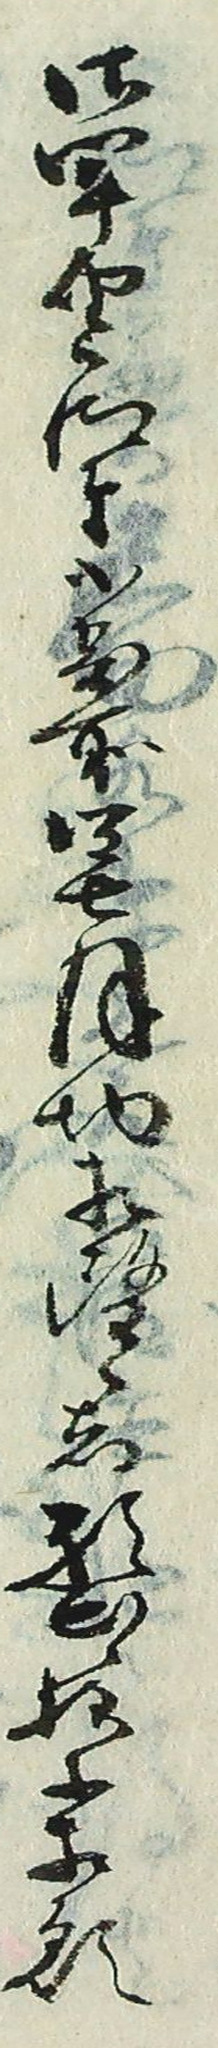御聞届被仰付小寄所閏七月切相望候者願出候様不相願
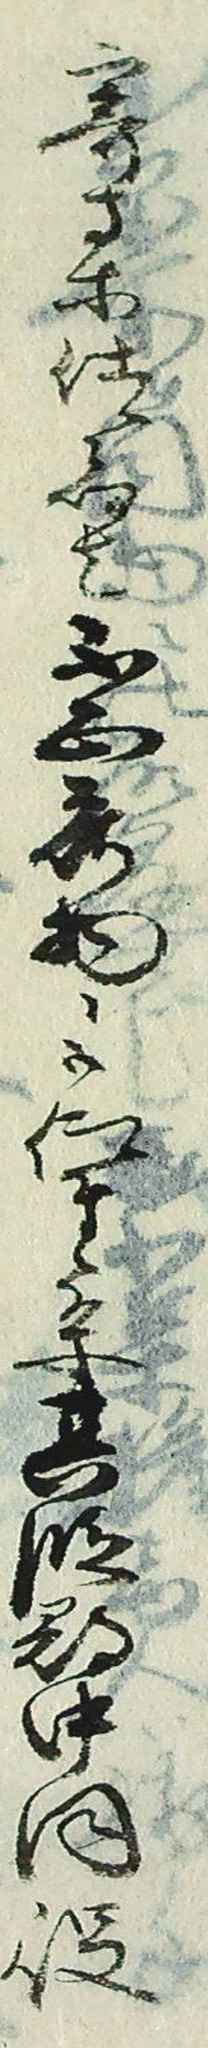寄方等仕候者者不正荷物に被仰付候条其段郡中同役
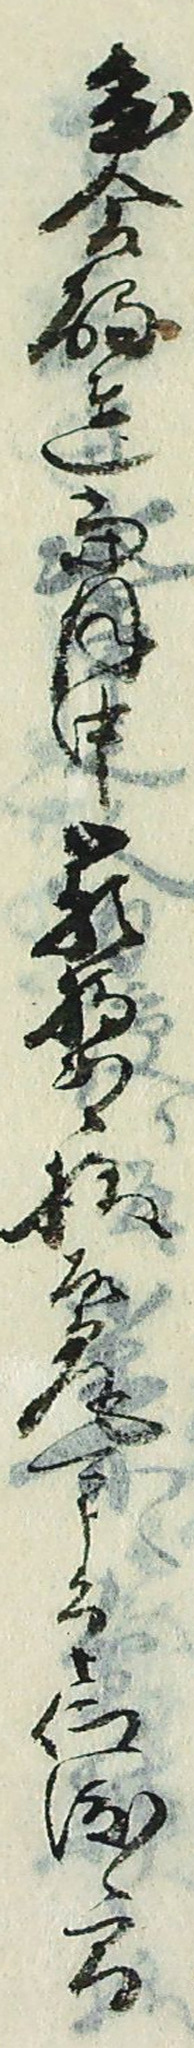懸合触達当月中御願指出候様取究可申旨被仰渡候間
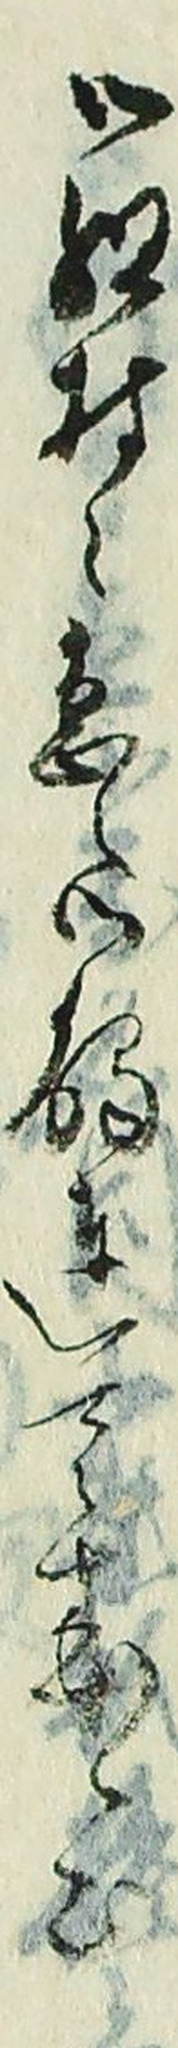御組村々急々御触達可被成候以上
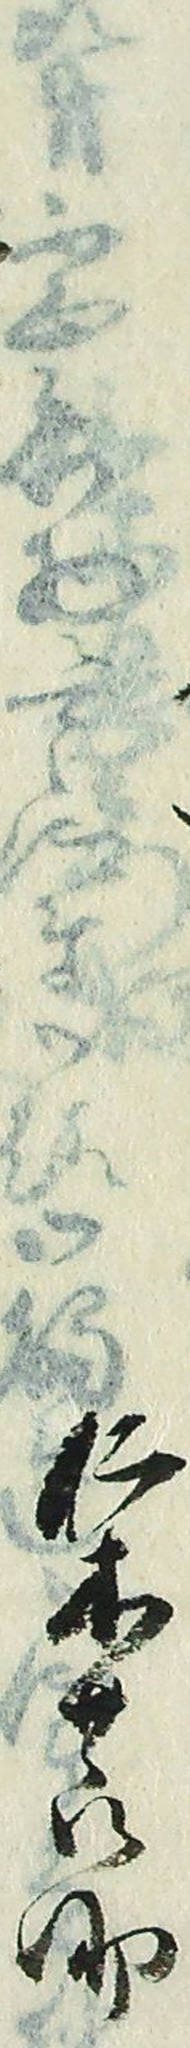仁木節助
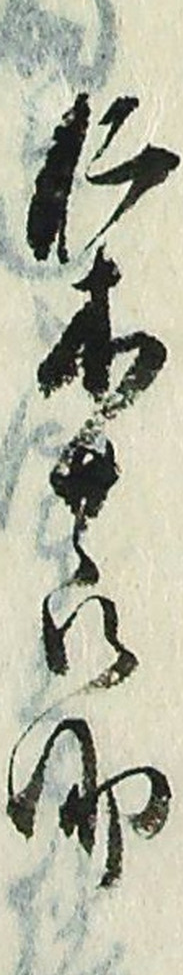仁木節助
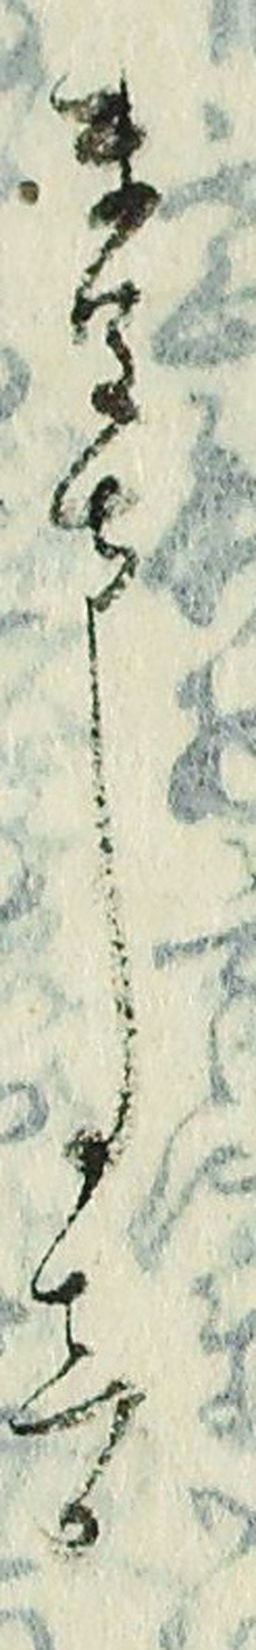未閏七月十一日
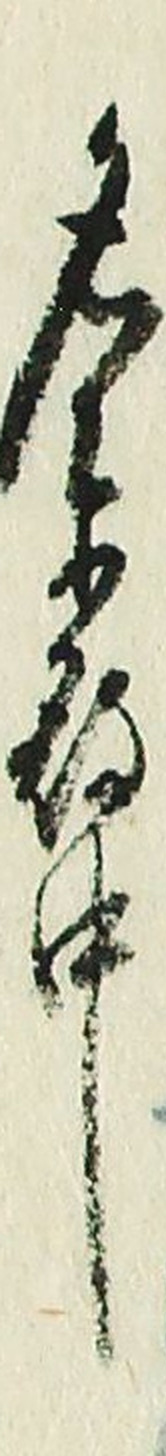名東郡中
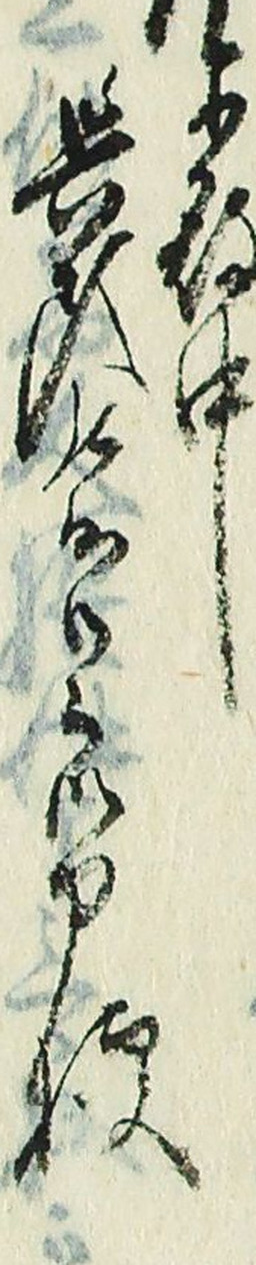与頭庄屋御衆中様
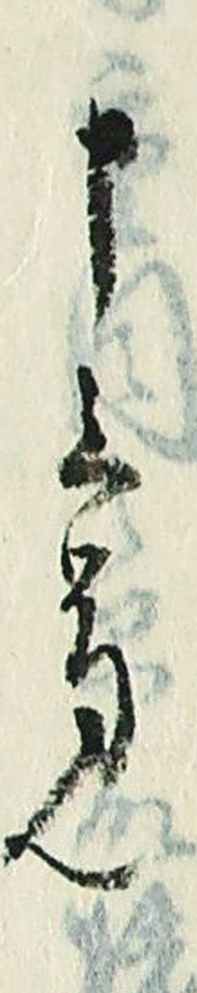申上覚
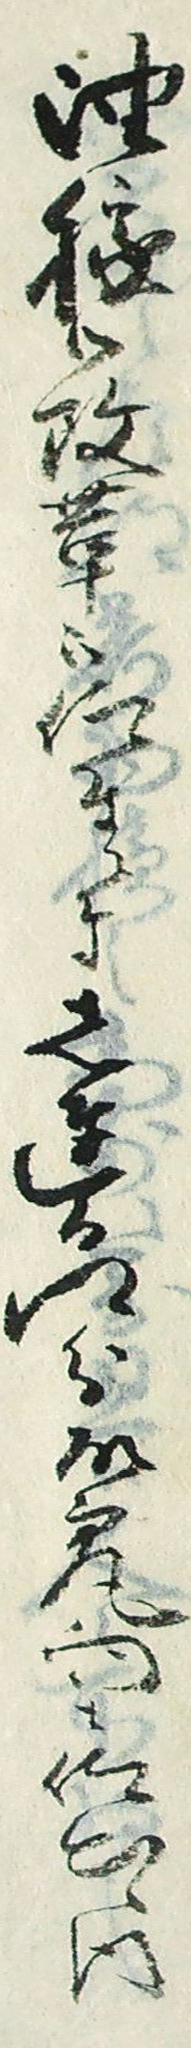油稼御改革被仰付に付先達而郷分取究向被仰出候内

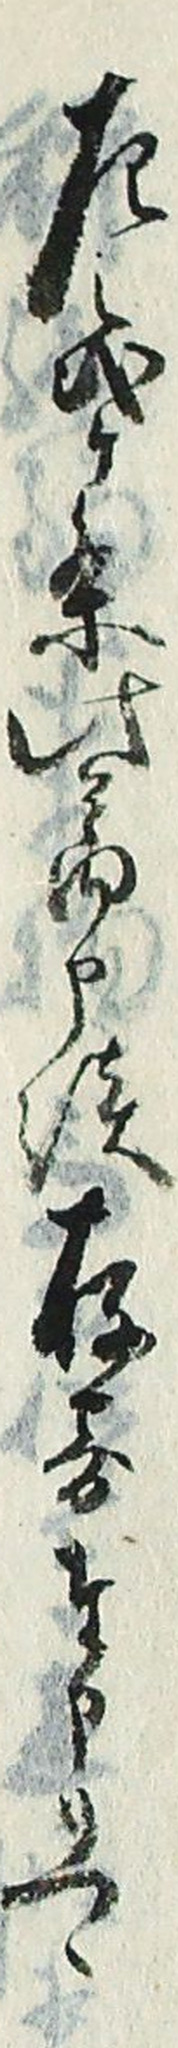左之弐ケ条此節申談存寄奉申上候
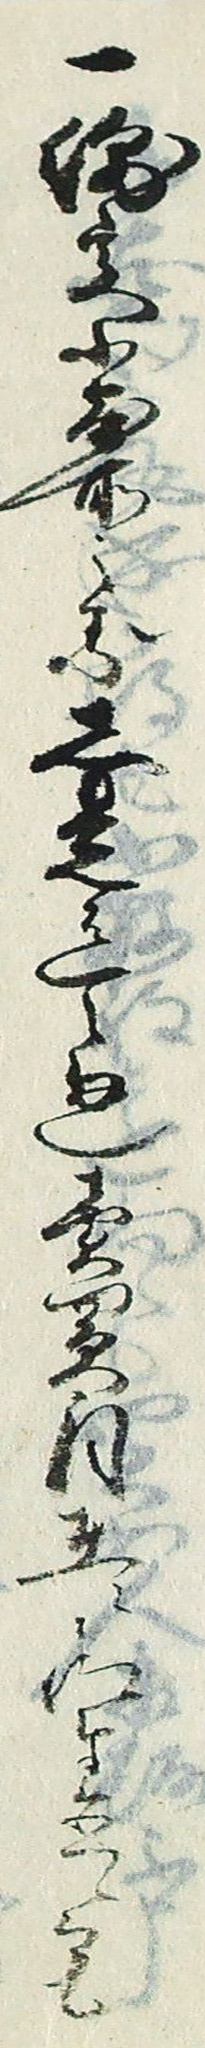一綿実小寄所之義先是迄之通売買自在に被仰付置候而も
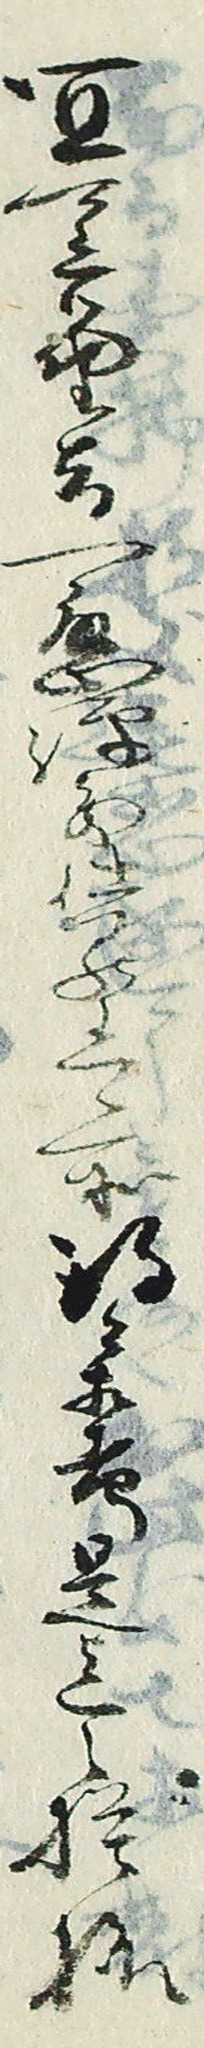宜可有御坐旨一応評義仕罷有候所得と相考是迄之模様
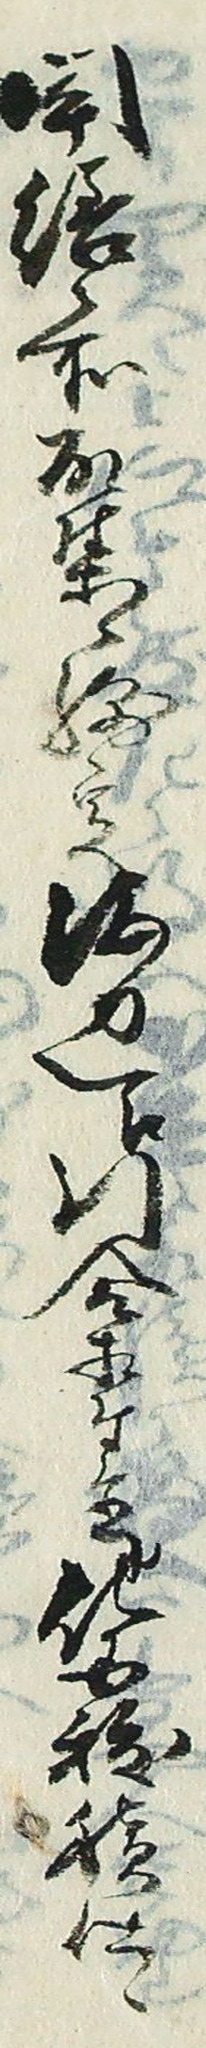聞繕候所取集候綿実海辺江引合相付置他国抜積仕候
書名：油稼御取究ニ附御箇條書テ以被仰渡南北同役申談御答書控
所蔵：鳴門教育大学 Naruto University of Education
